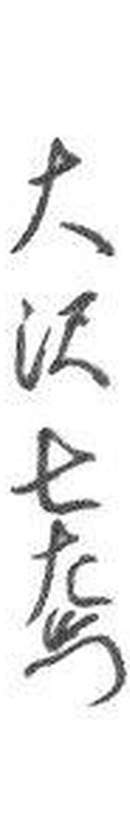大沢七左衛門
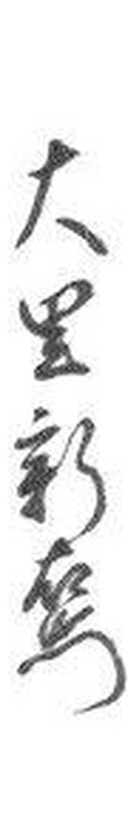大里新右衛門
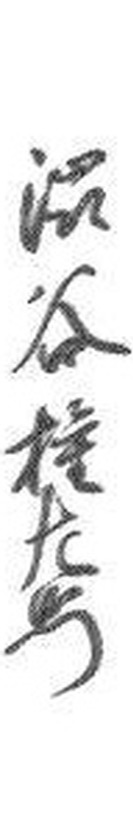渋谷権左衛門
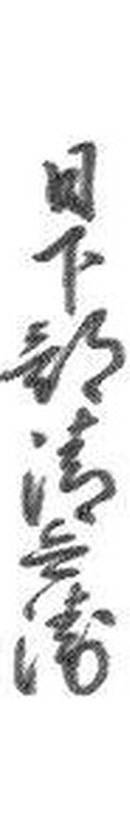日下部清兵衛
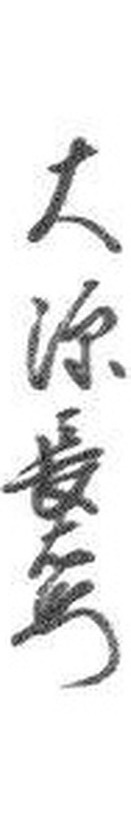大源長右衛門
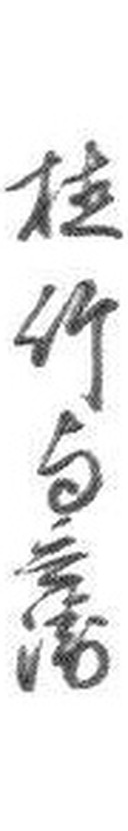植竹与兵衛
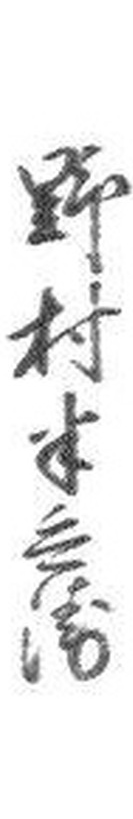野村半兵衛
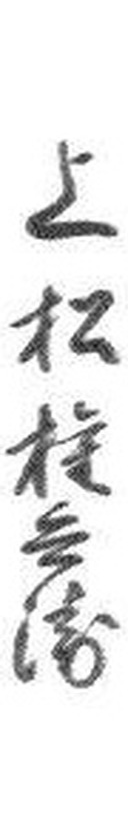上松権兵衛
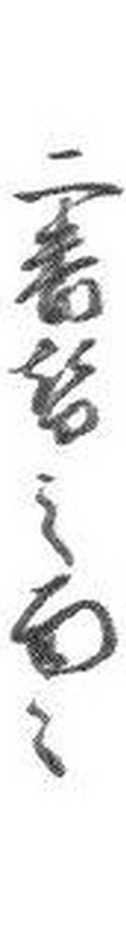二番替之面々
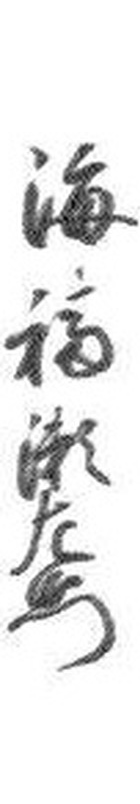海福瀬左衛門
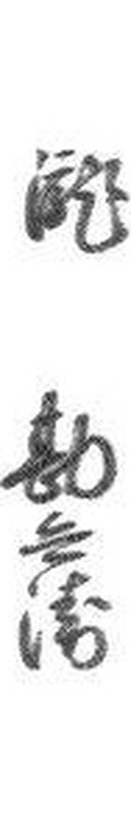瀧勘兵衛

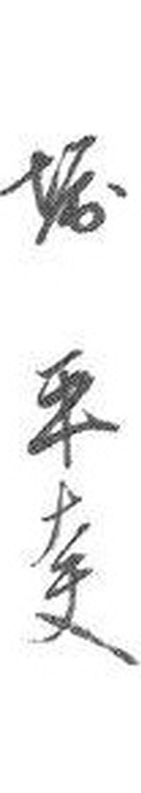堀平太夫
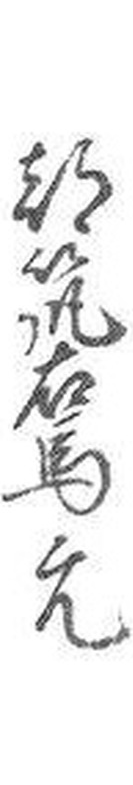都筑右馬允
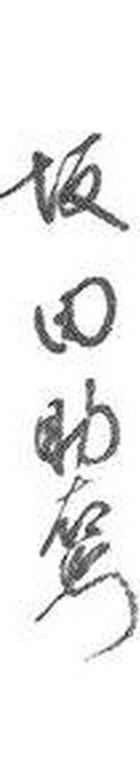坂田助右衛門
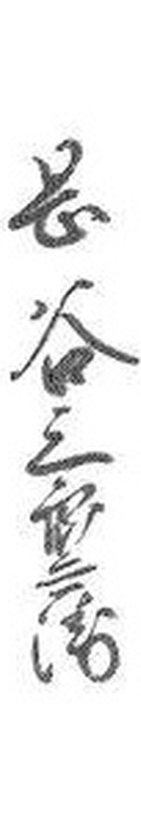岡谷三郎兵衛
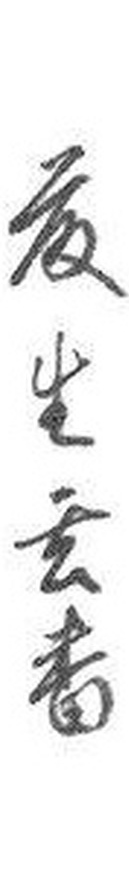藤生玄番
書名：家譜 四 忠昌公 従寛永七年到正保四年
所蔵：福井県文書館 Fukui Prefectural Archives
